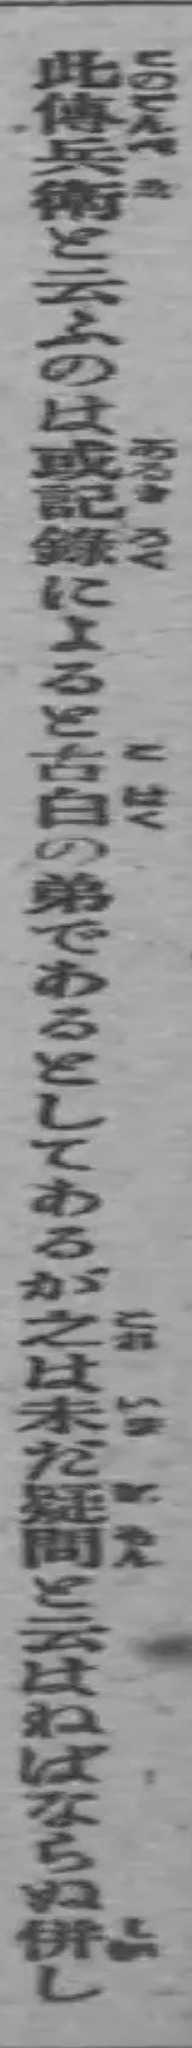此傳兵衛と云うふのは或記録によると古白の弟であるとしてあるが之は未だ疑問と云はねばならぬ併し
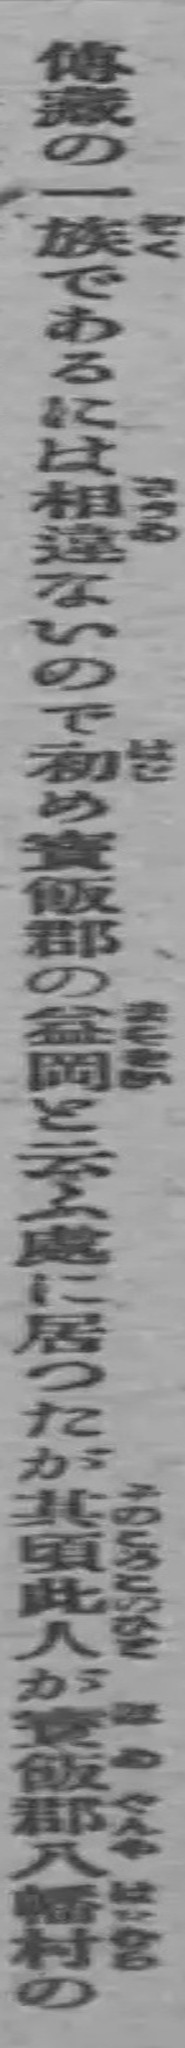傳蔵の一族であるには相違ないので初め宝飯郡の益岡と云ふ処に居つたが其頃此人が宝飯郡八幡村の
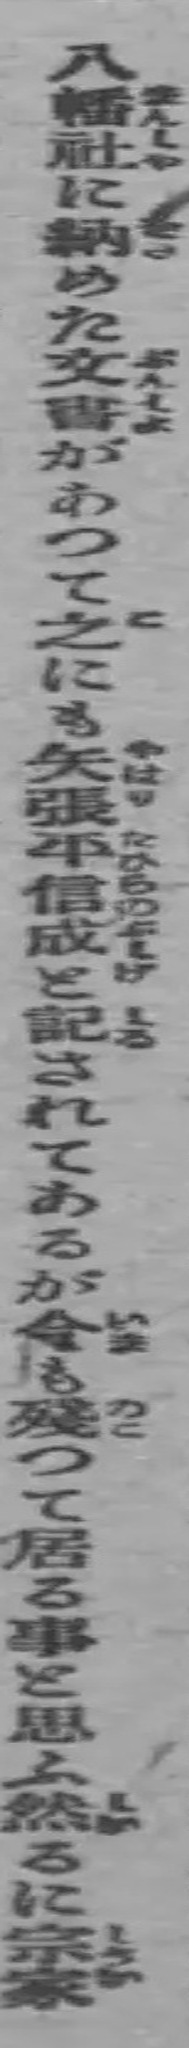八幡社に納めた文書があつて之にも矢張平信成と記されてあるが今も残つて居る事と思ふ然るに宗家
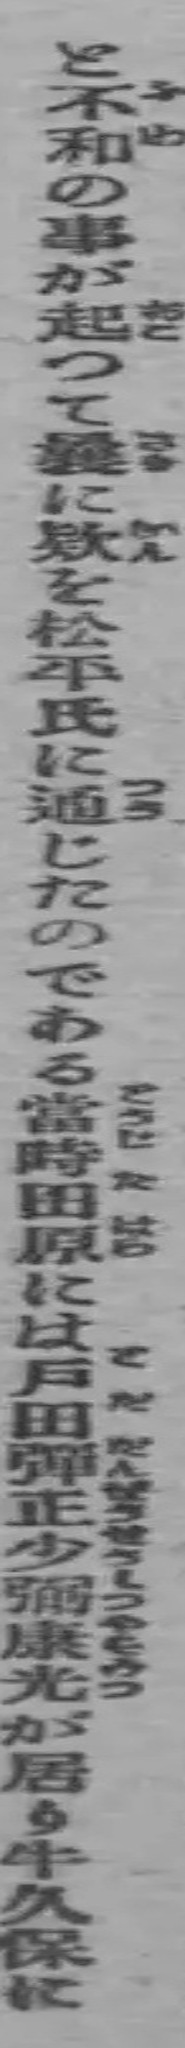と不和の事が起つて曩に款を松平氏に通じたのである当時田原には戸田弾正少弼康光が居り牛久保に
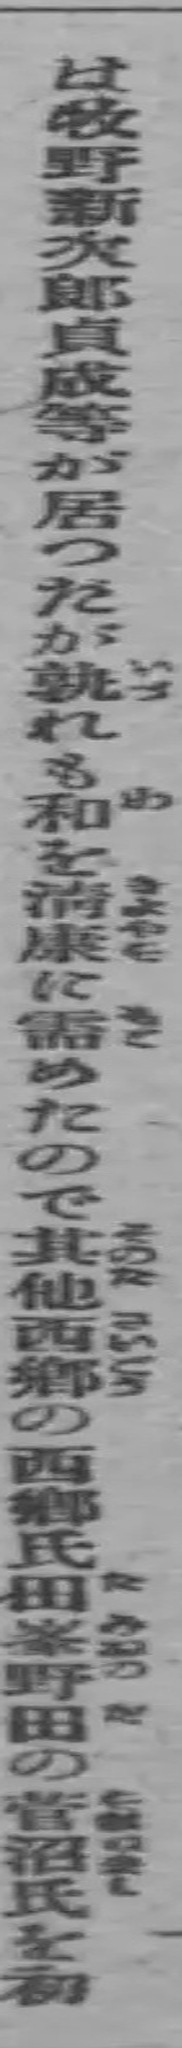は牧野新次郎貞成等が居つたが孰れも和を清康に需めたので其他西郷の西郷氏田峯野田の菅沼氏を初
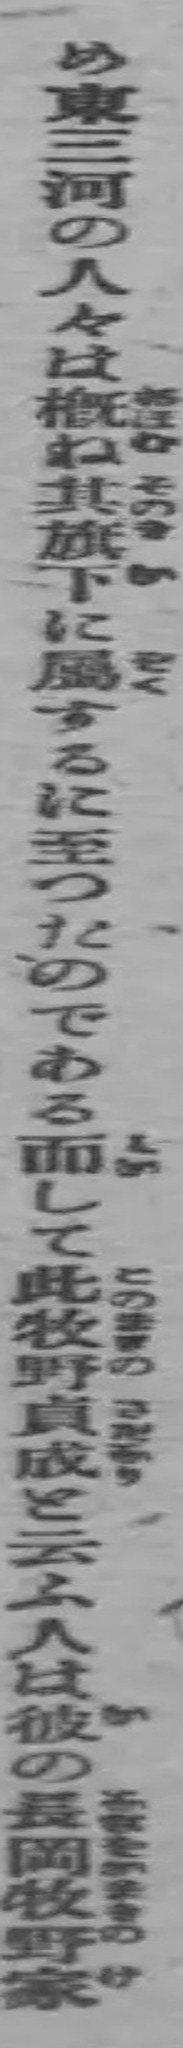め東三河の人々は概ね其旗下に属するに至つたのである而して此牧野貞成と云ふ人は彼の長岡牧野家
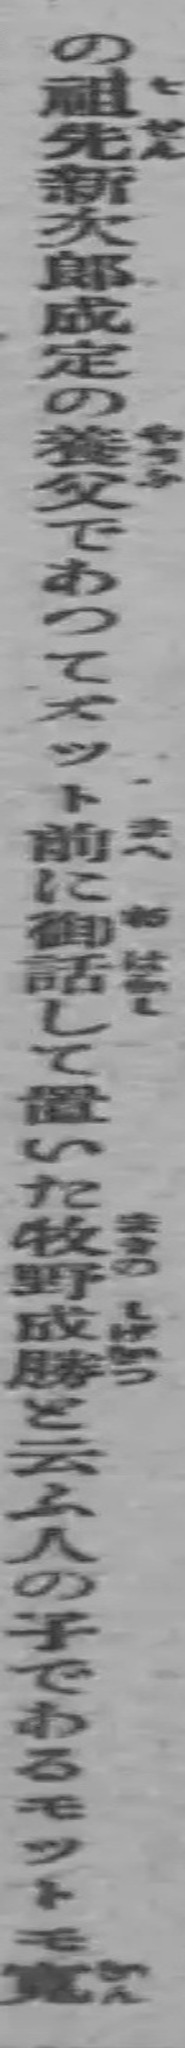の祖先新次郎成定の養父であつてズツト前に御話して置いた牧野成勝と云ふ人の子であるモツトモ寛
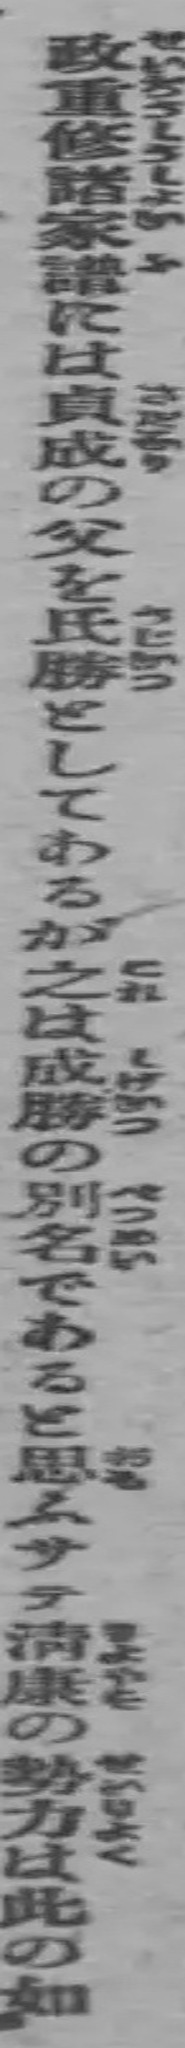政重修諸家譜には貞成の父を氏勝としてあるが之は成勝の別名であると思ふサテ清康の勢力は此の如
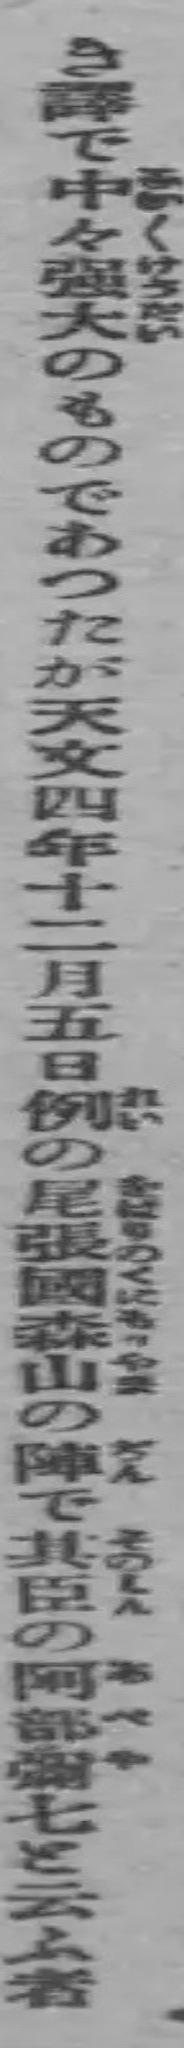き訳で中々強大のものであつたが天文四年十二月五日例の尾張国森山の陣で其臣の阿部弥七と云ふ者
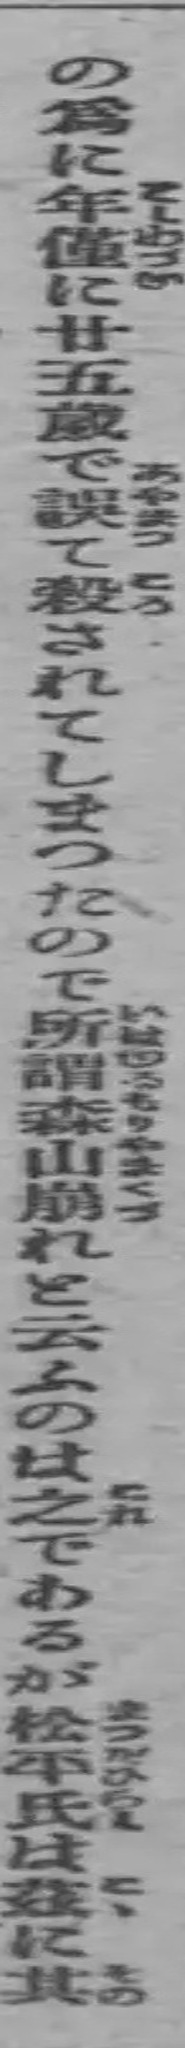の為に年僅に廿五歳で誤て殺されてしまつたので所謂森山崩れと云ふのは之であるが松平氏は茲に其
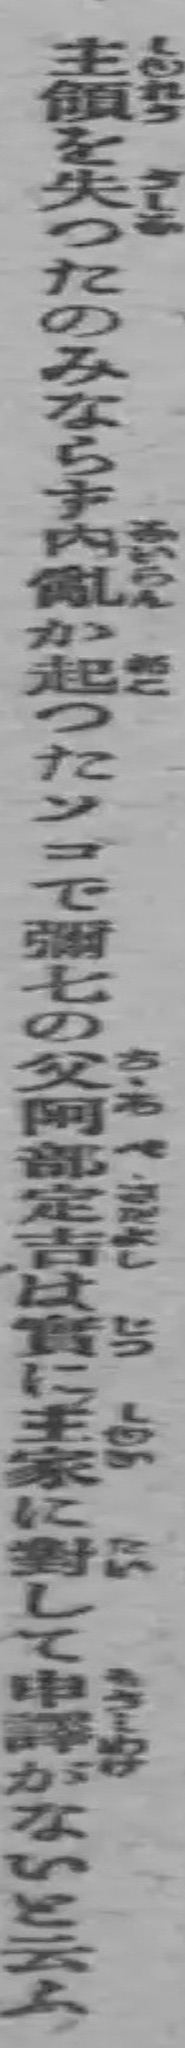主領を失つたのみならず内乱か起つたソコで弥七の父阿部定吉は実に主家に対して申訳がないと云ふ
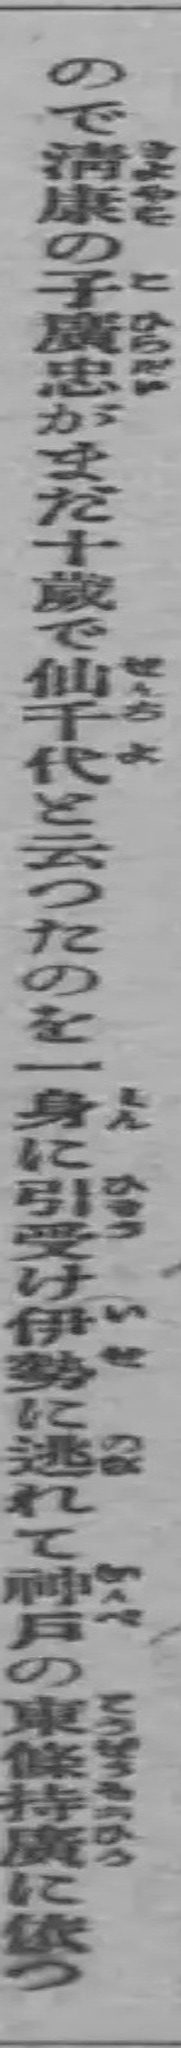ので清康の子広忠がまだ十歳で仙千代と云つたのを一身に引受け伊勢に逃れて神戸の東條持広に依つ
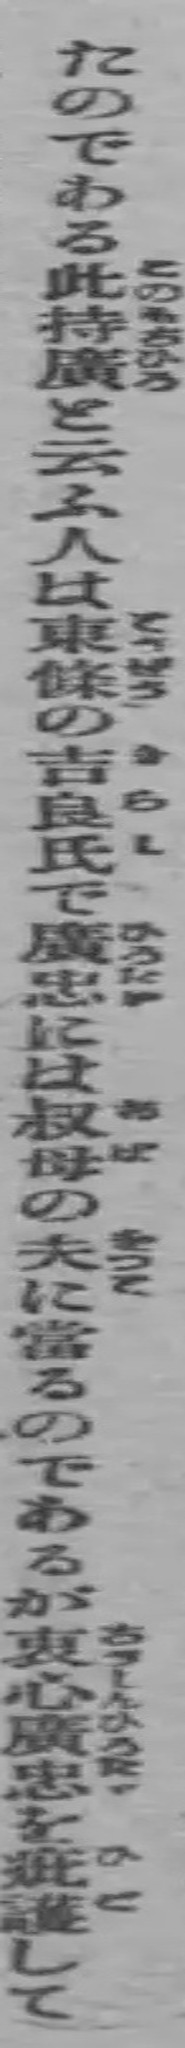たのである此持広と云ふ人は東條の吉良氏で広忠には叔母の夫に当るのであるが衷心広忠を庇護して
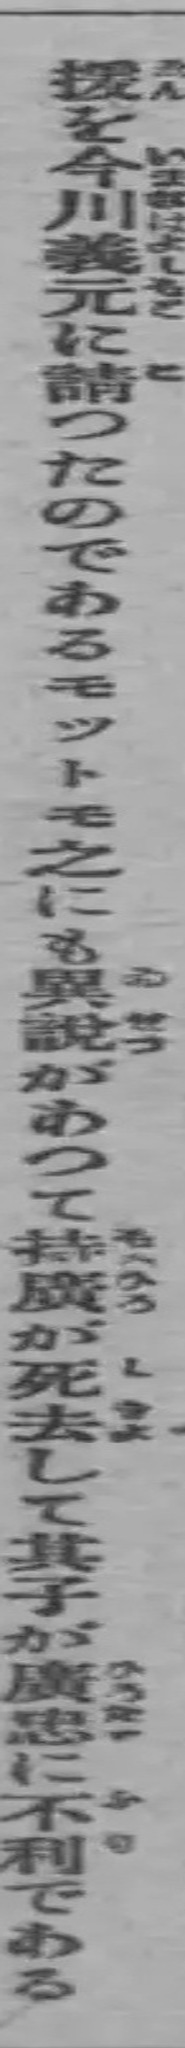援を今川義元に請つたのであるモツトモ之にも異説があつて持広が死去して其子が広忠に不利である
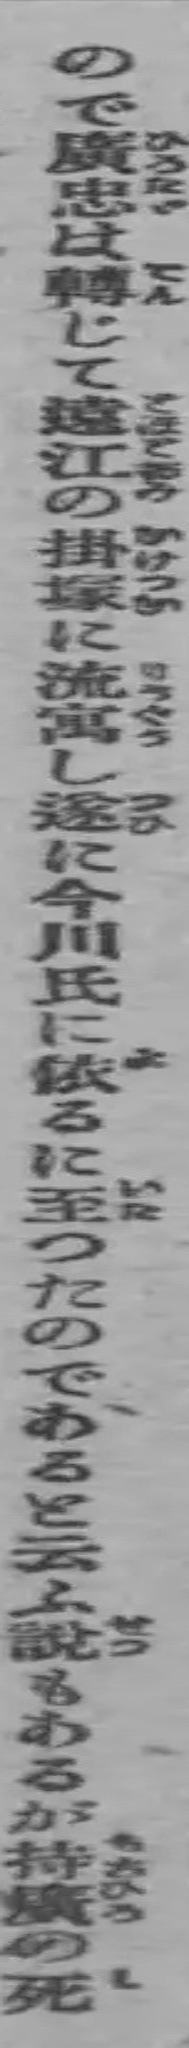ので広忠は転じて遠江の掛塚に流寓し遂に今川氏に依るに至つたのであると云ふ説もあるが持広の死
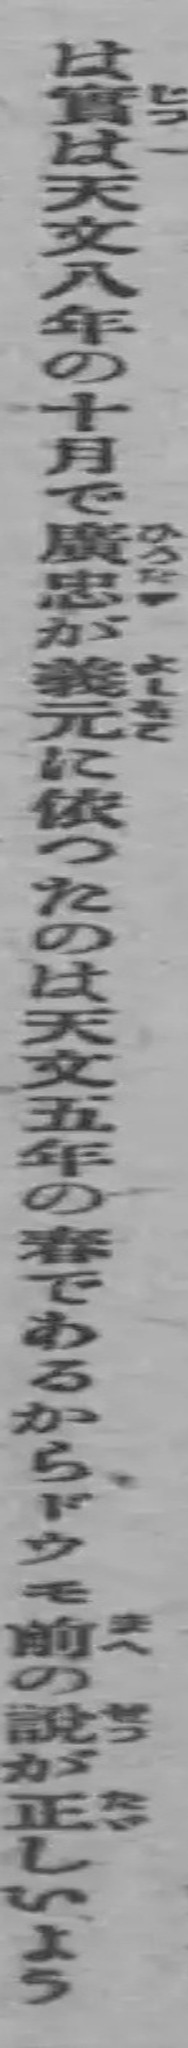は実は天文八年の十月で広忠が義元に依つたのは天文五年の春であるからドウモ前の説が正しいよう
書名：豊橋市史談
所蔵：国立国会図書館 National Diet Library, JAPAN
